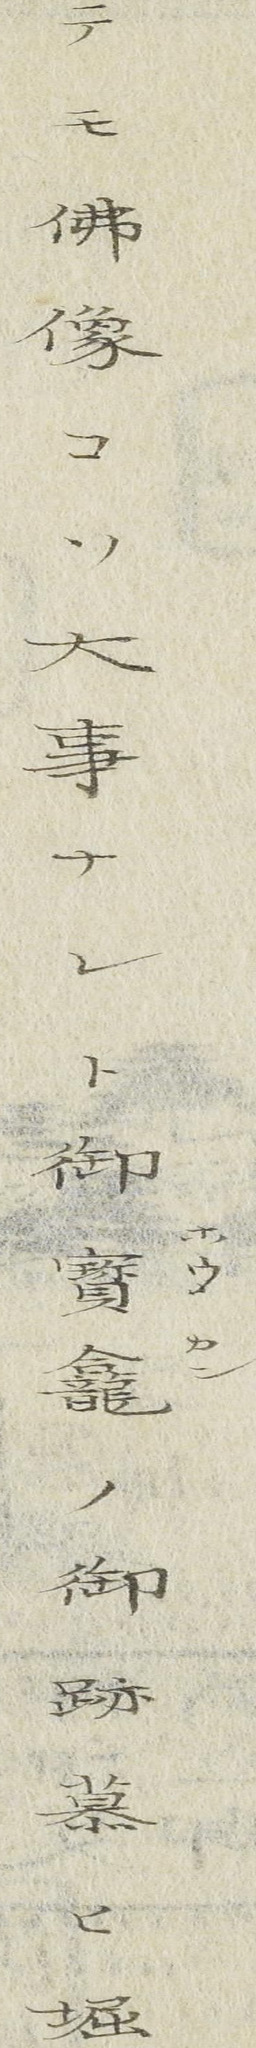テモ仏像コソ大事ナレト御宝龕ノ御跡慕ヒ堀
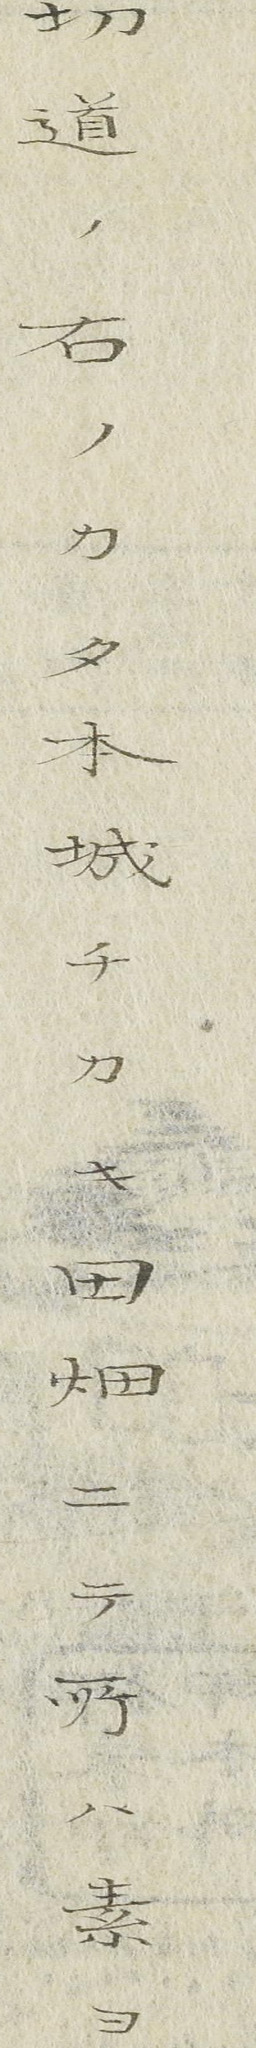切道ノ右ノカタ本城チカキ田畑ニテ所ハ素ヨ
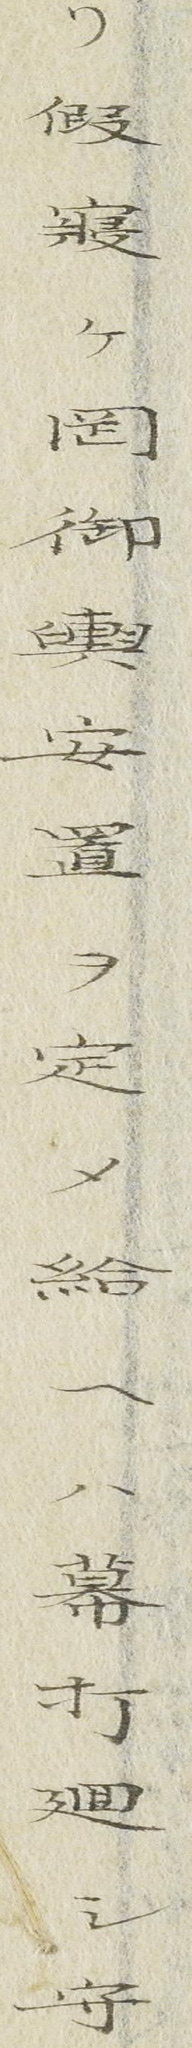リ仮寝ケ岡御輿安置ヲ定メ給ヘハ幕打廻シ守
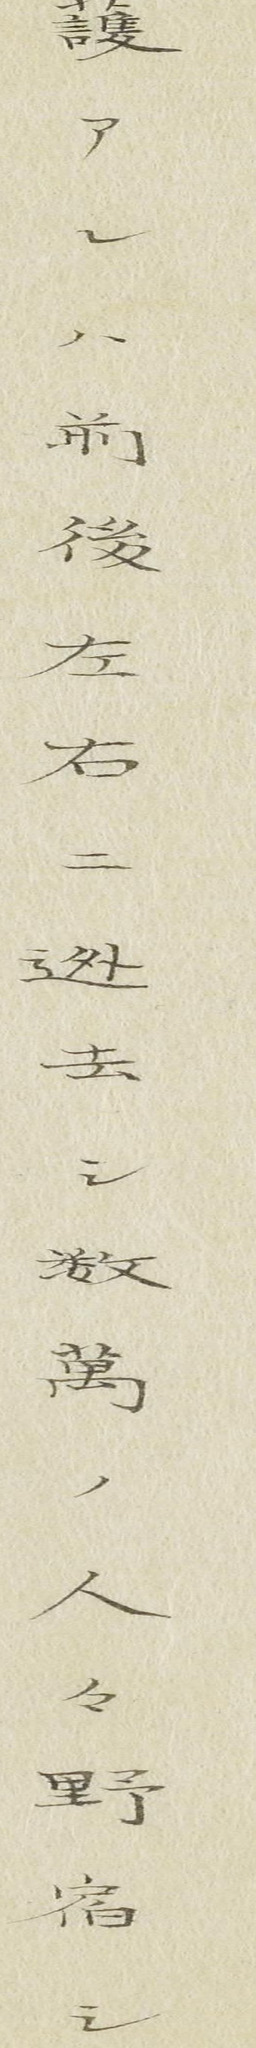護アレハ前後左右ニ迯去シ数万ノ人々野宿シ
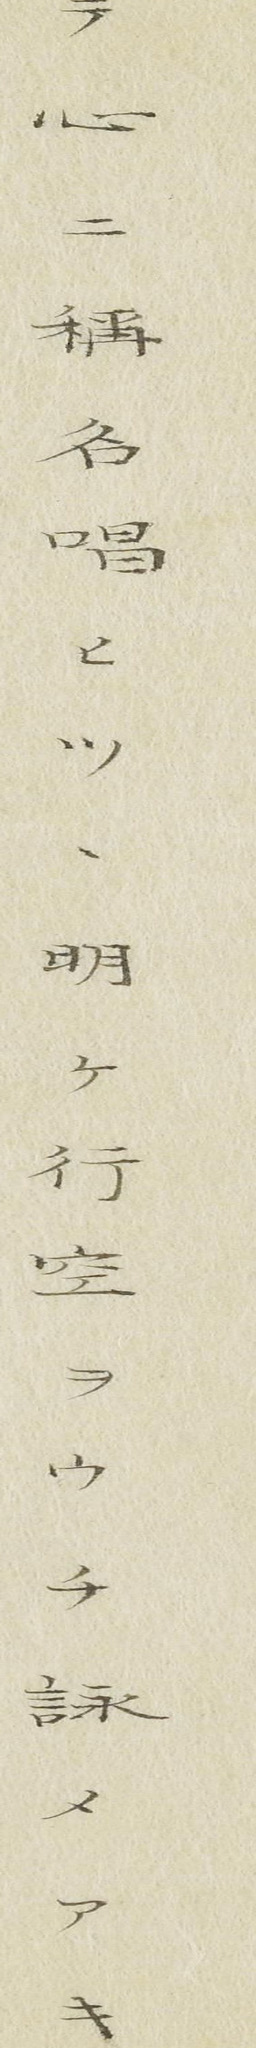テ心ニ称名唱ヒツヽ明ケ行空ヲウチ詠メアキ
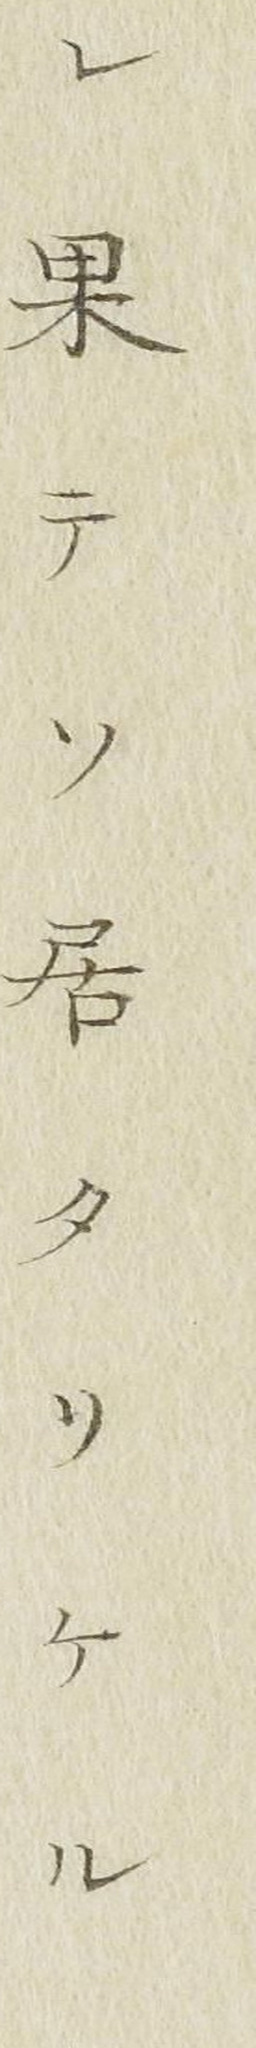レ果テソ居タリケル

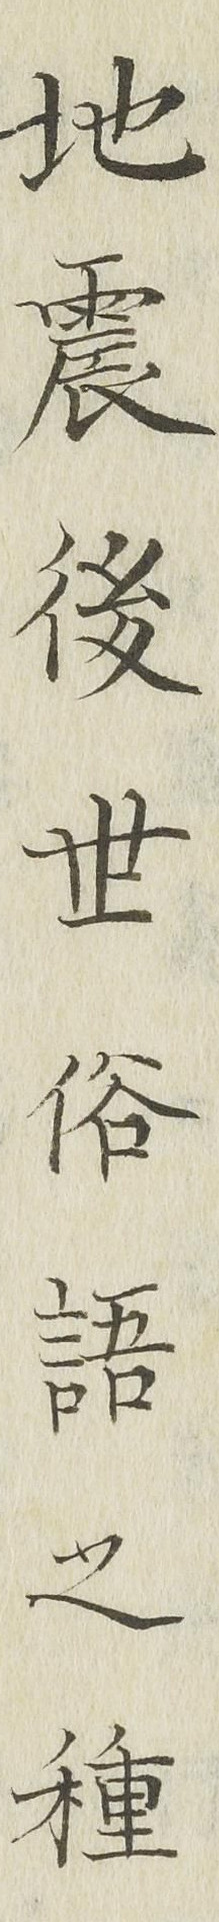地震後世俗語之種

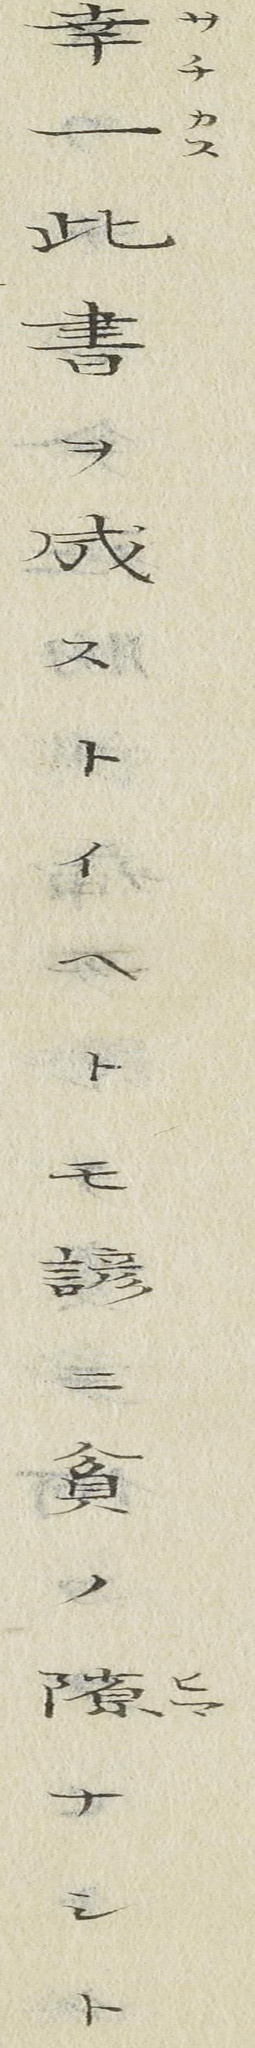幸一此書ヲ成ストイヘトモ諺ニ貧ノ隙ナシト
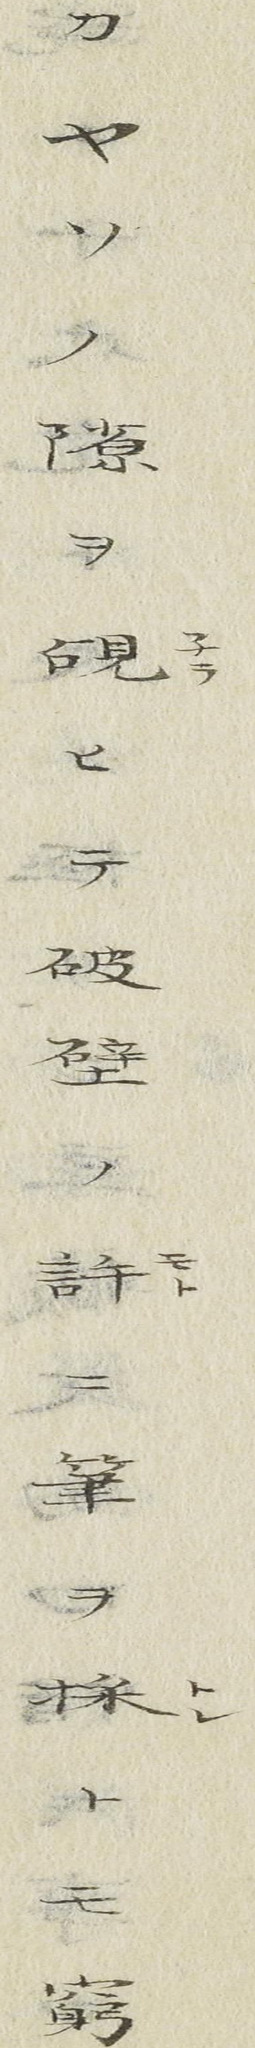カヤソノ隙ヲ覘ヒテ破壁ノ許ニ筆ヲ採トモ窮
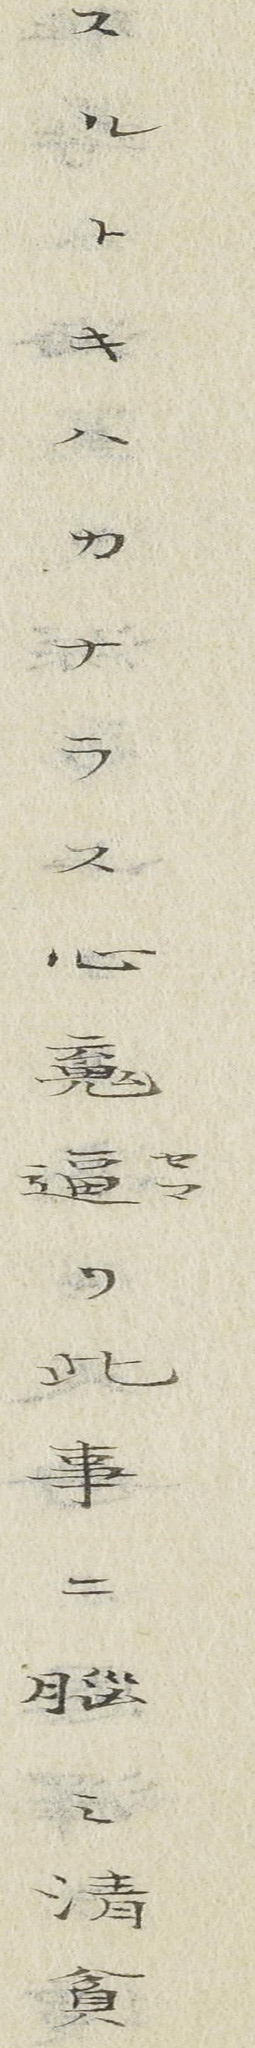スルトキハカナラス心魂逼リ此事ニ脳ミ清貧
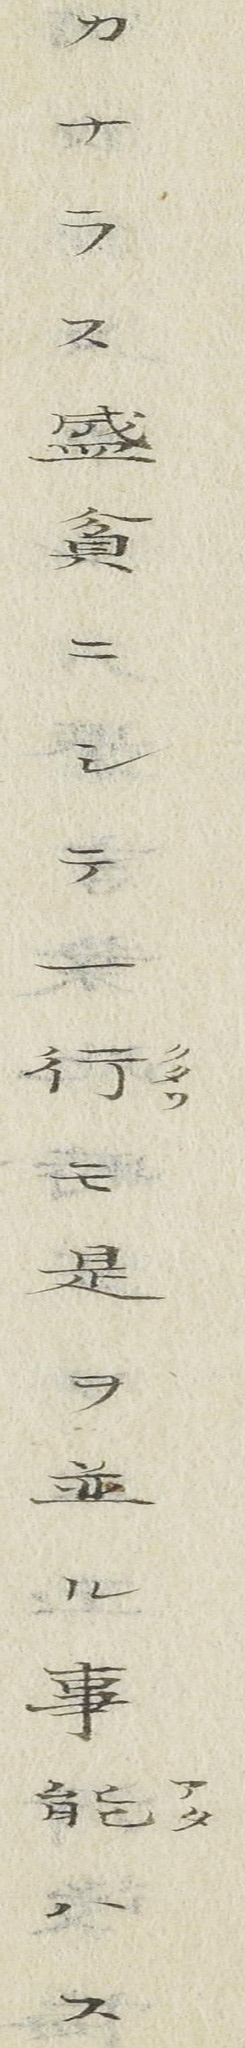カナラス盛貧ニシテ一行モ是ヲ並ル事能ハス
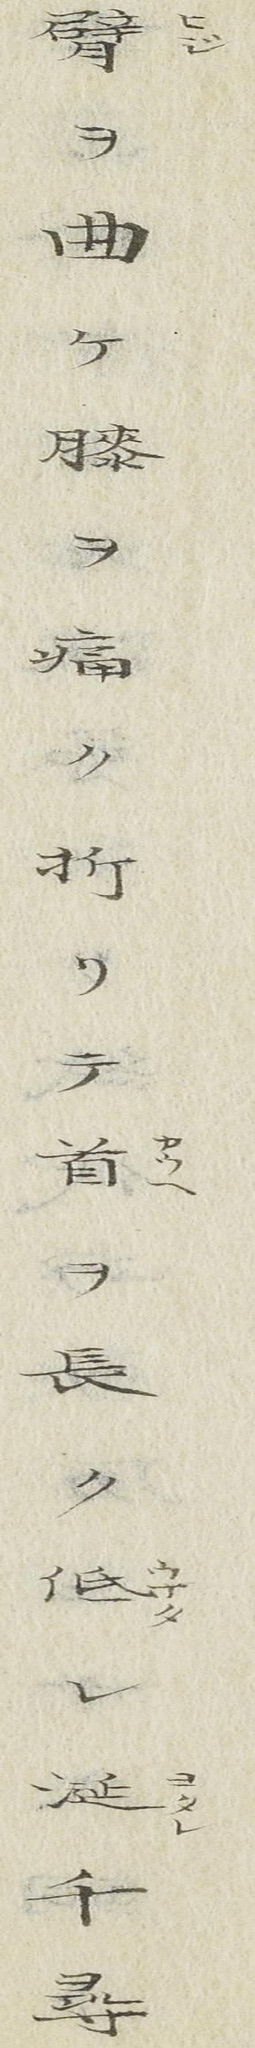臂ヲ曲ケ膝ヲ痛ク折リテ首ヲ長ク低レ涎千尋
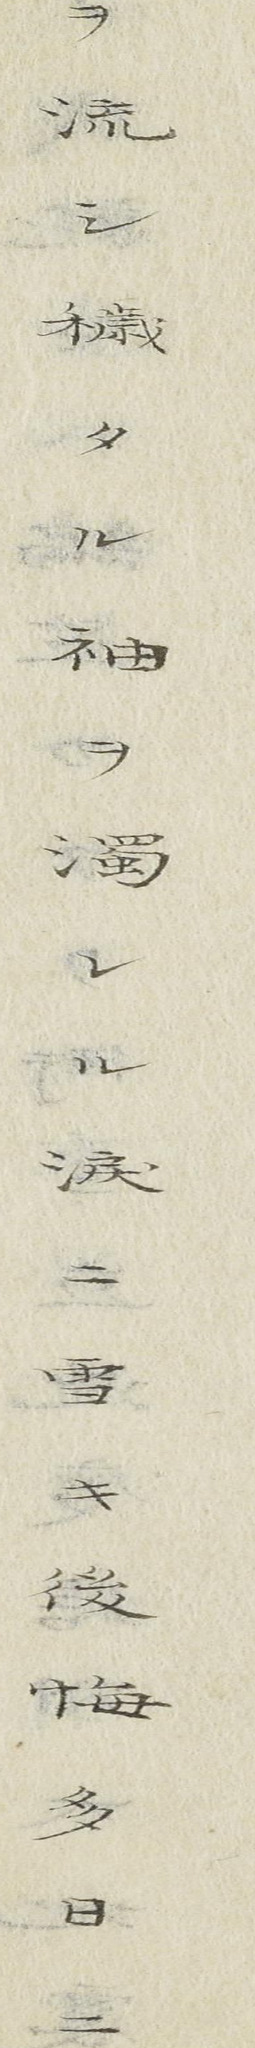ヲ流シ穢タル袖ヲ濁レル涙ニ雪キ後悔多日ニ
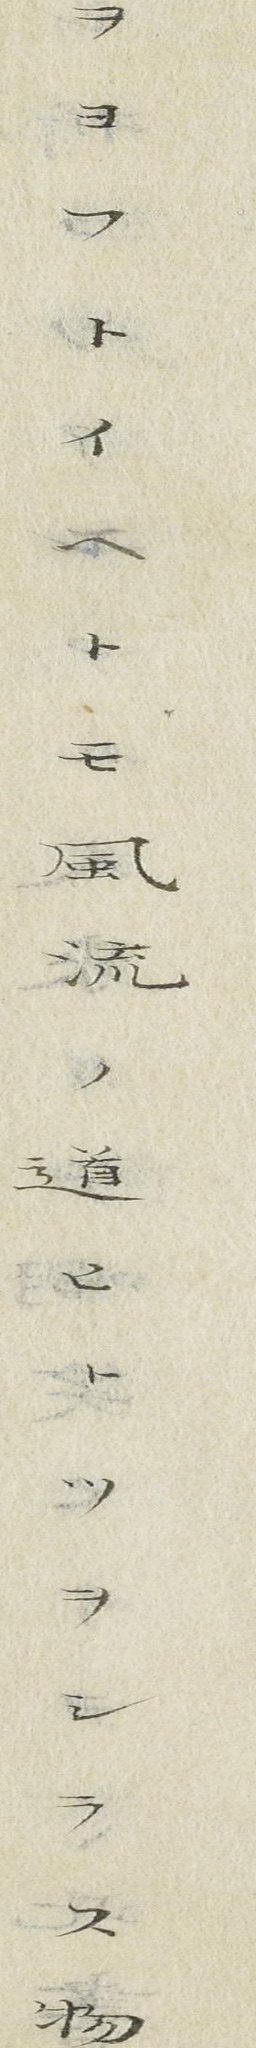ヲヨフトイヘトモ風流ノ道ヒトツヲシラス物
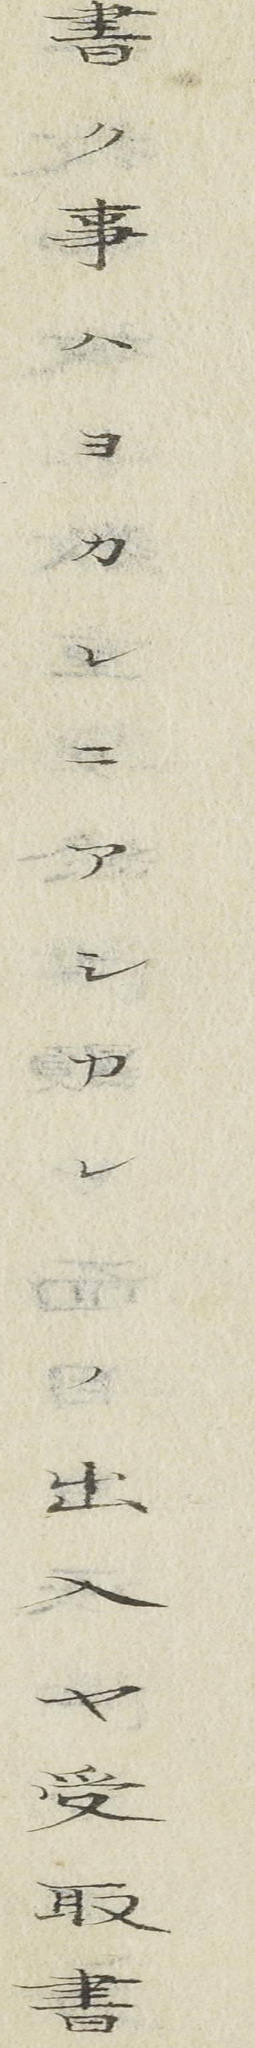書ク事ハヨカレニアシカレノ出入ヤ受取書
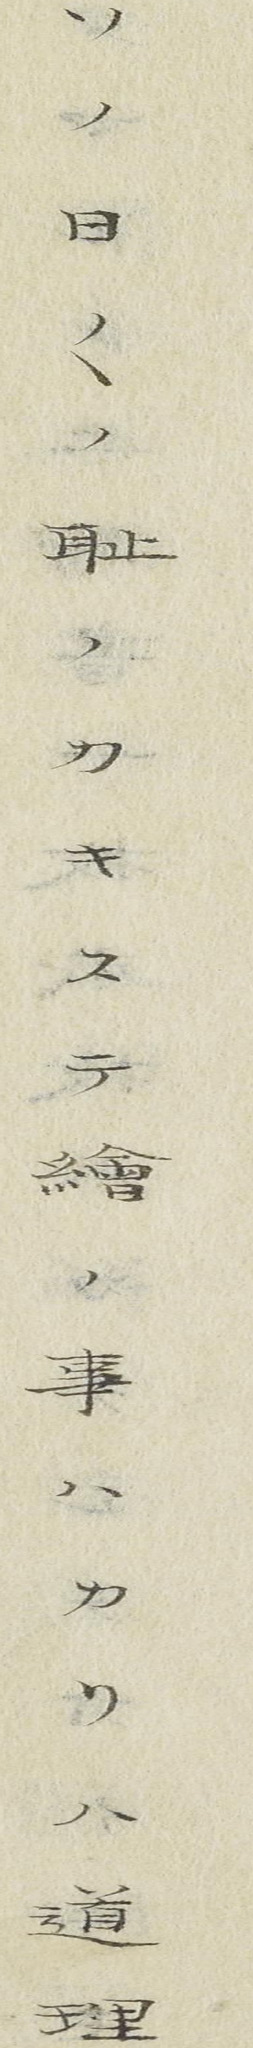ソノ日〱ノ恥ノカキステ絵ノ事ハカリハ道理
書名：地災撮要　地震之部　巻ノ二
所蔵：東京大学地震研究所図書室 Earthquake Research Institute Library, The University of Tokyo, JAPAN
